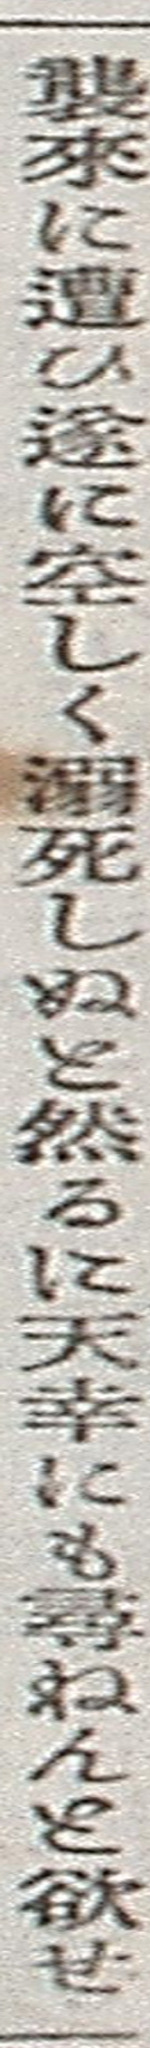襲来に遭ひ遂に空しく溺死しぬと然るに天幸にも尋ねんと欲せ

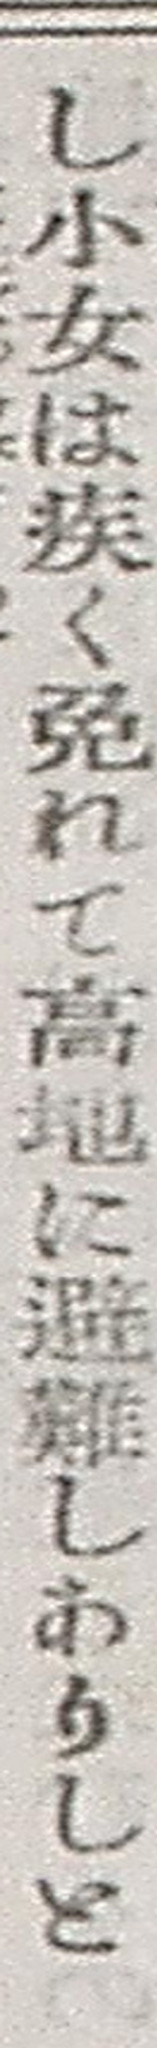し小女は疾く免れて高地に避難しありしと
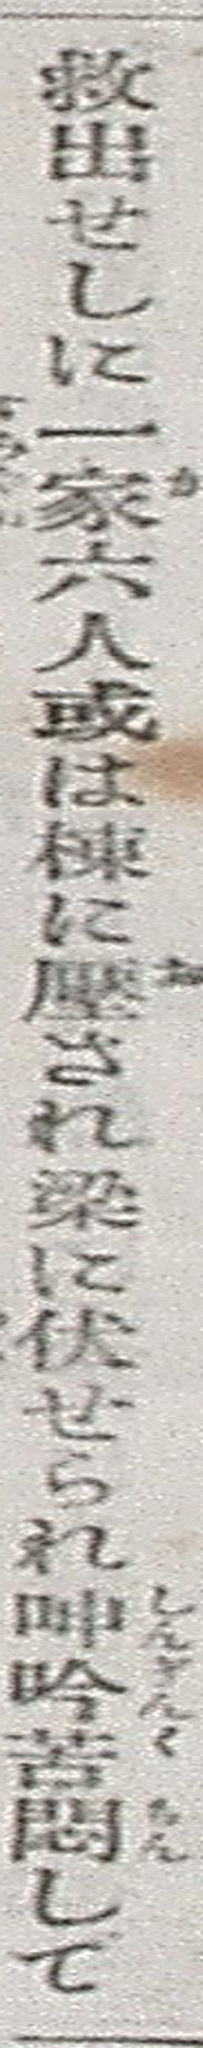救出せしに一家六人或は棟に圧され梁に伏せられ呻吟苦悶して
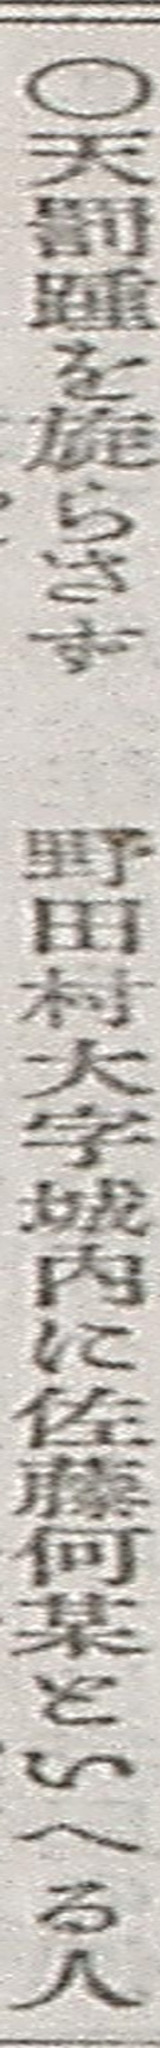○天罰踵を旋らさず野田村大字城内に佐藤何某といへる人
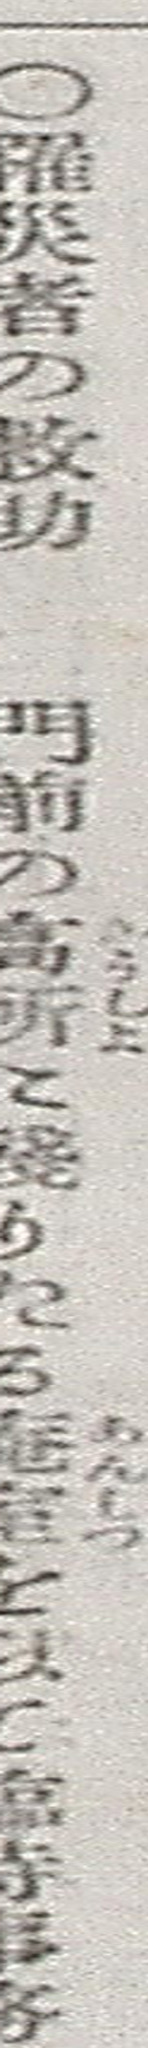○罹災者の救助門前の高所に残りたる庵室を以て臨時事務
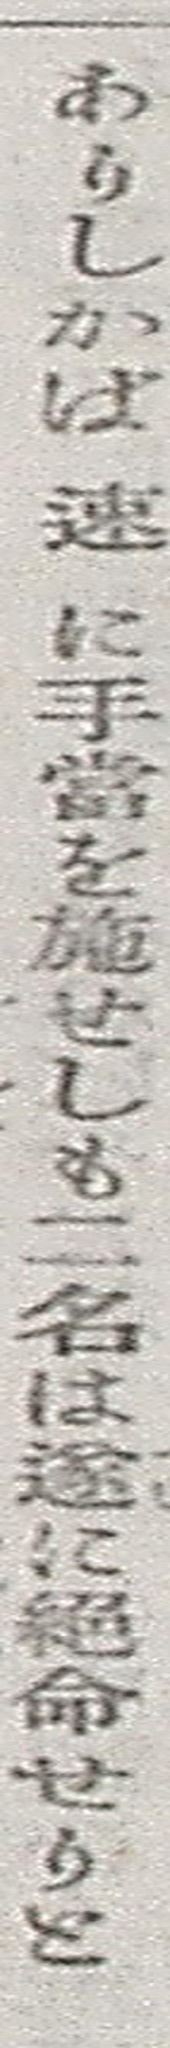ありしかば速に手当を施せしも二名は遂に絶命せりと
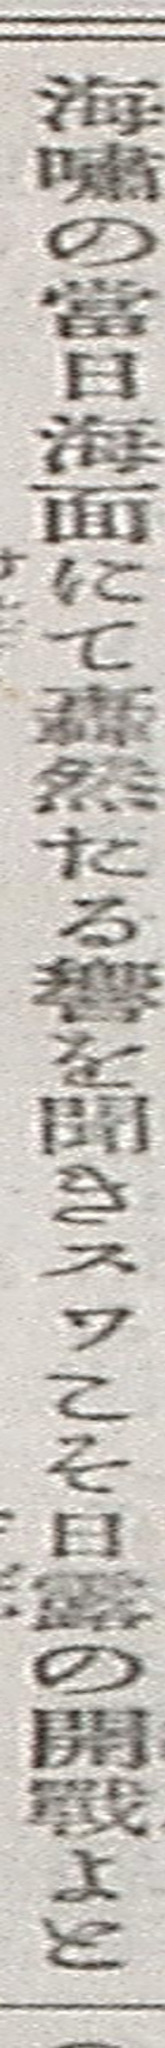海嘯の当日海面にて轟然たる響を聞きスワこそ日露の開戦よと
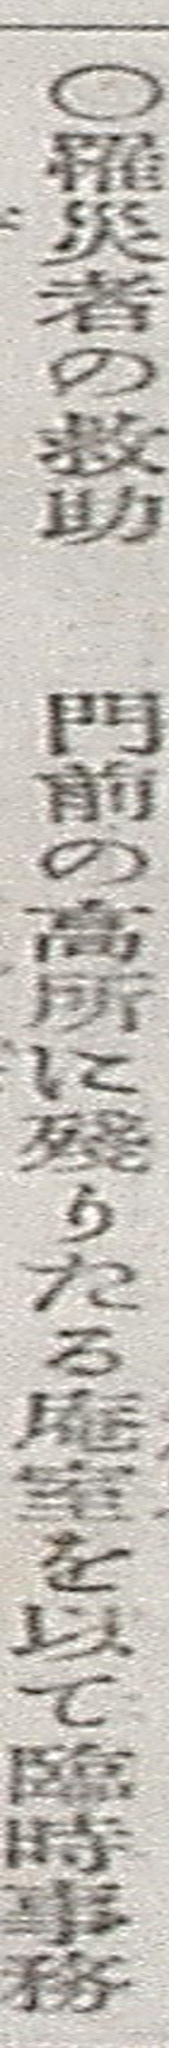○罹災者の救助門前の高所に残りたる庵室を以て臨時事務
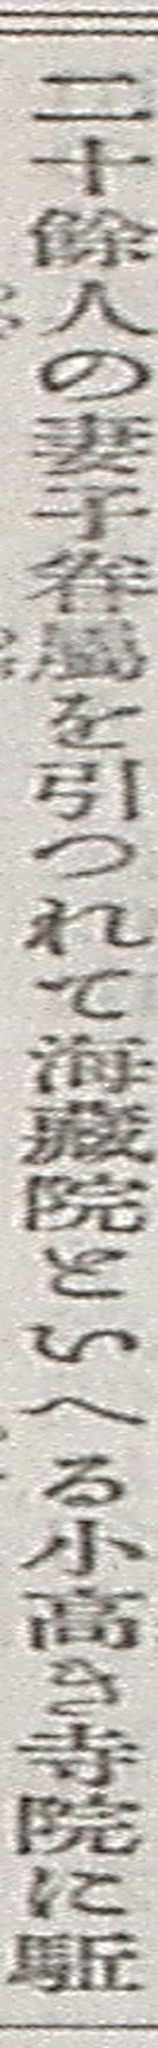二十余人の妻子眷属を引つれて海蔵院といへる小高き寺院に駈
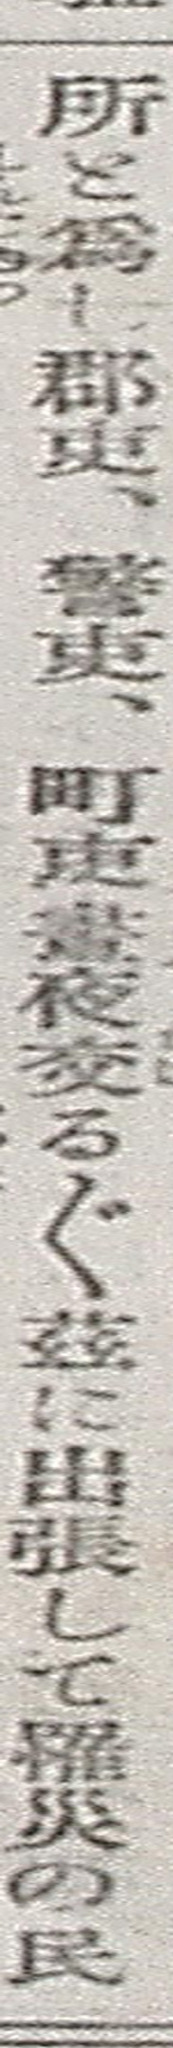所と為し郡吏、警吏、町吏昼夜交る〴〵茲に出張して罹災の民
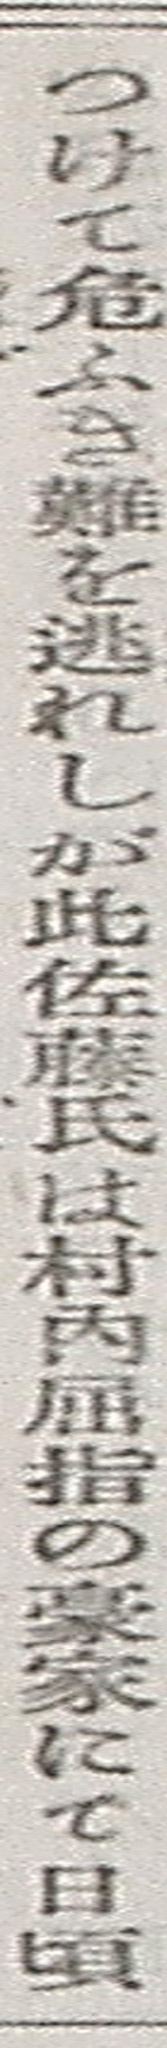つけて危ふき難を逃れしが此佐藤氏は村内屈指の豪家にて日頃
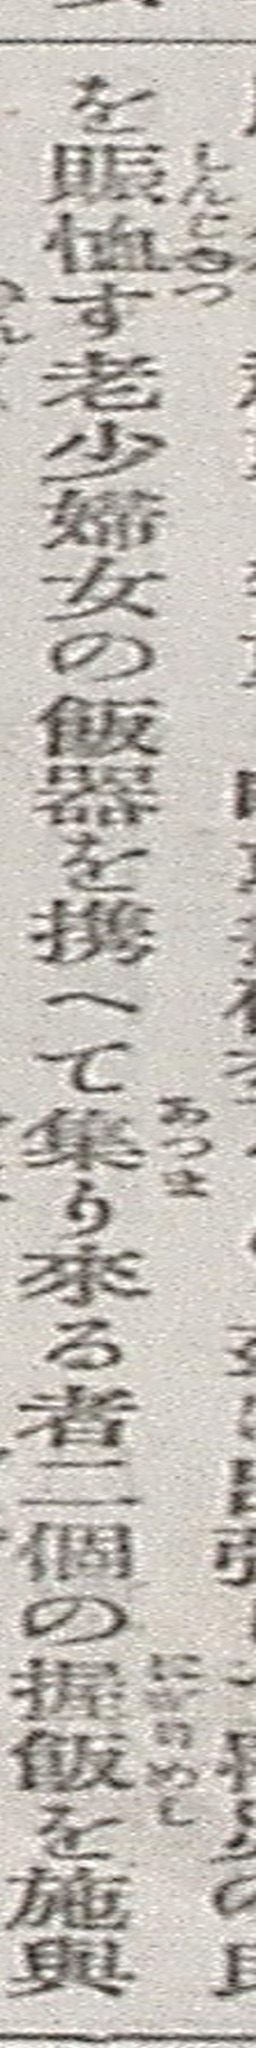を賑恤す老少婦女の飯器を携へて集り来る者二個の握飯を施与
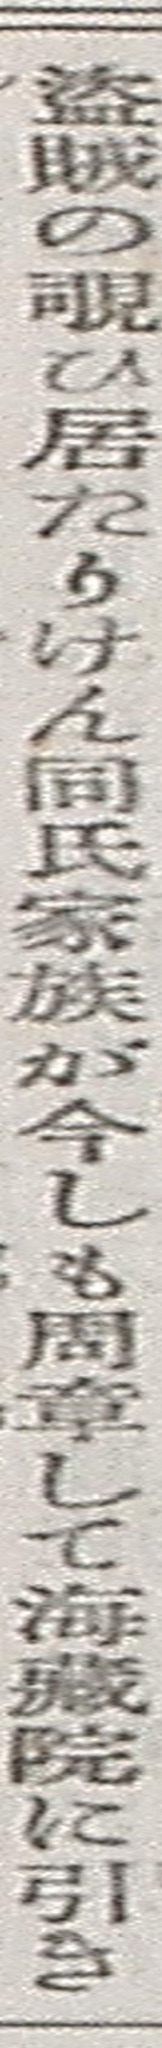盗賊の覗ひ居たりけん同氏家族が今しも周章して海蔵院に引き
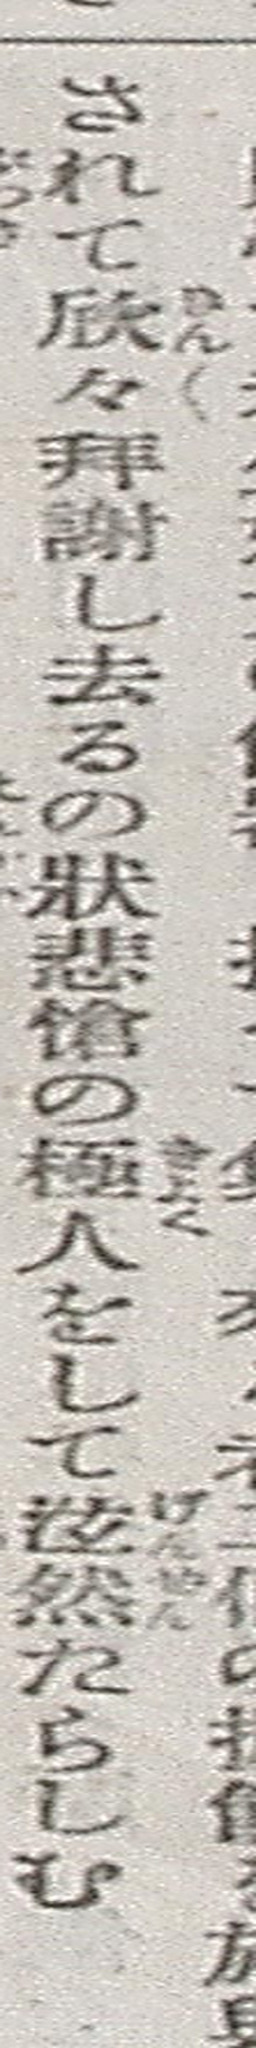されて欣々拜謝し去るの状悲愴の極人をして泫然たらしむ
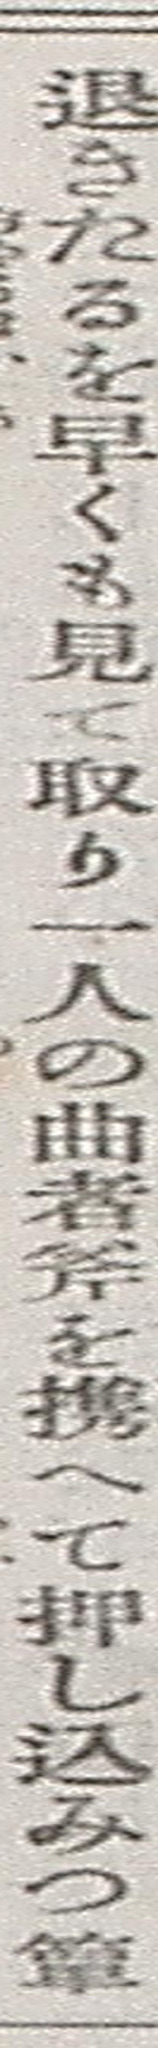退きたるを早くも見て取り一人の曲者斧を携へて押し込みつ箪
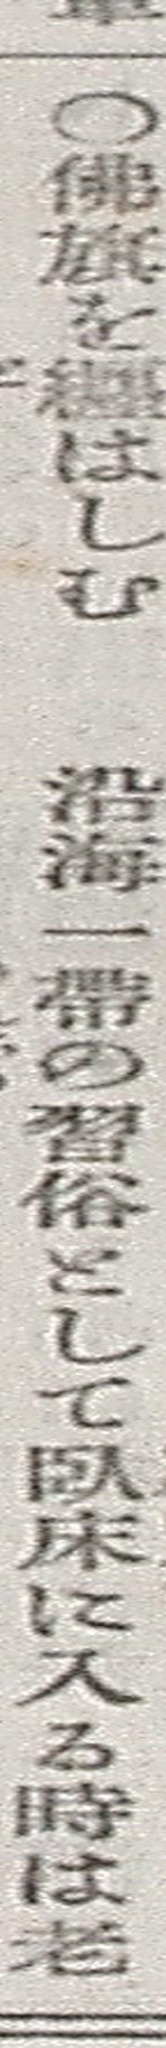○佛旗を纏はしむ沿海一帯の習俗として臥床に入る時は老
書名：風俗畫報臨時増刊第百二十號　大海嘯被害録（下）
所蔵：東京大学地震研究所図書室 Earthquake Research Institute Library, The University of Tokyo, JAPAN
